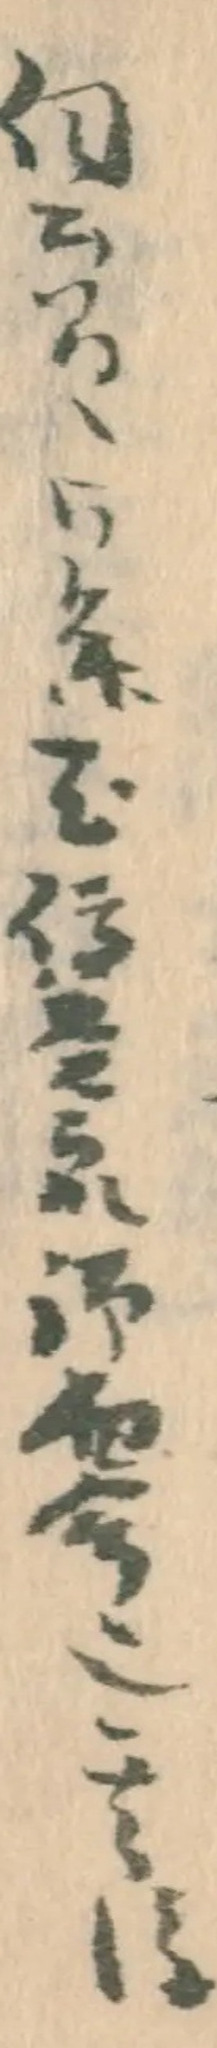伺公間へ被参尤伝奏衆御面会也其後
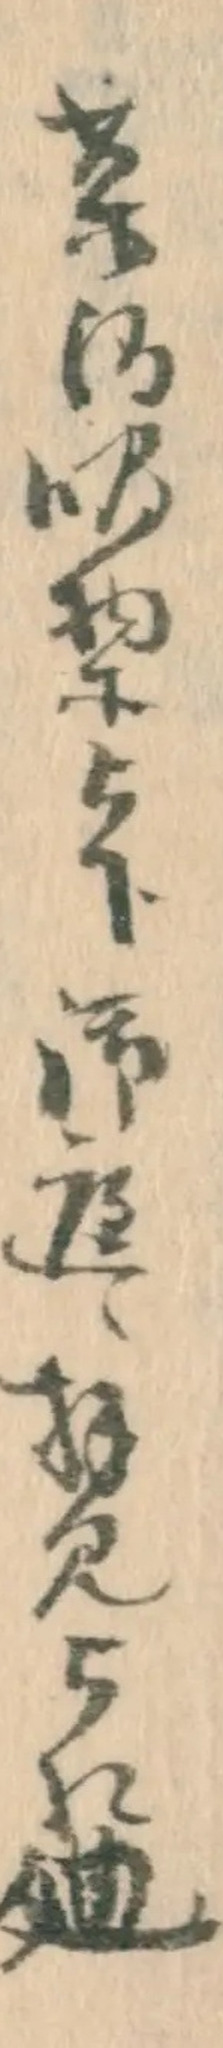茶酒吸物等被下御庭へ拝見被相廻
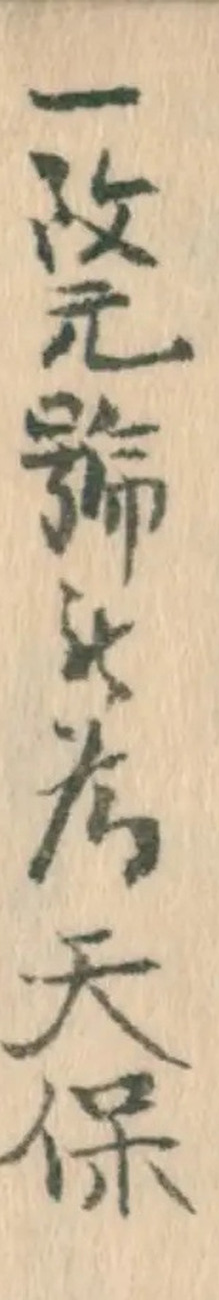一改元号被為天保
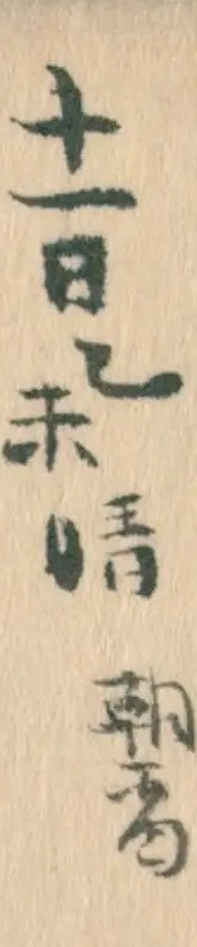十一日乙未晴朝雪
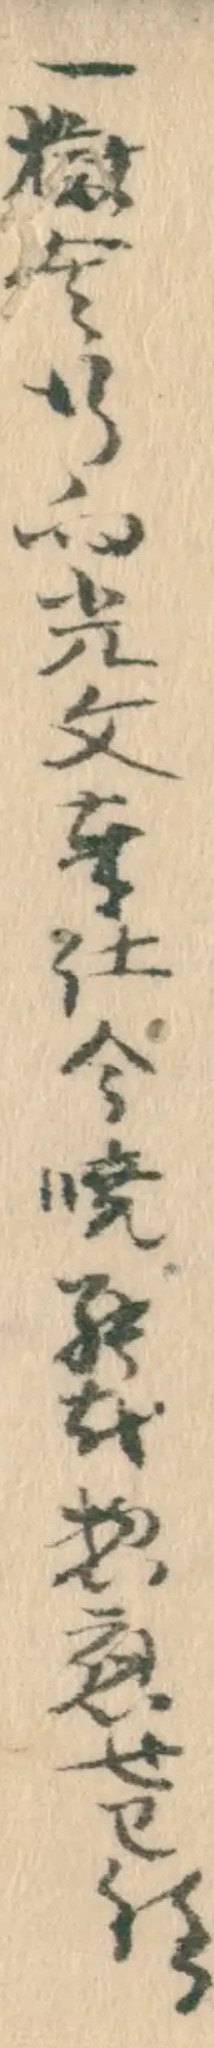一獄舎行向光文奉仕今晩罷越惣応せわ致ス
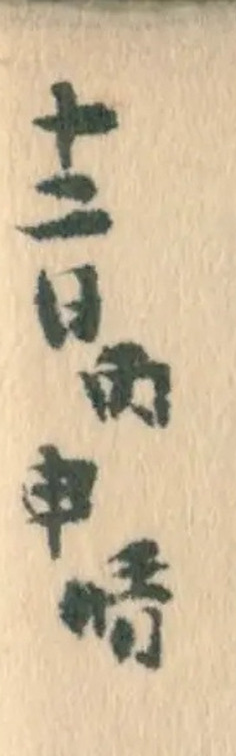十二日丙申晴

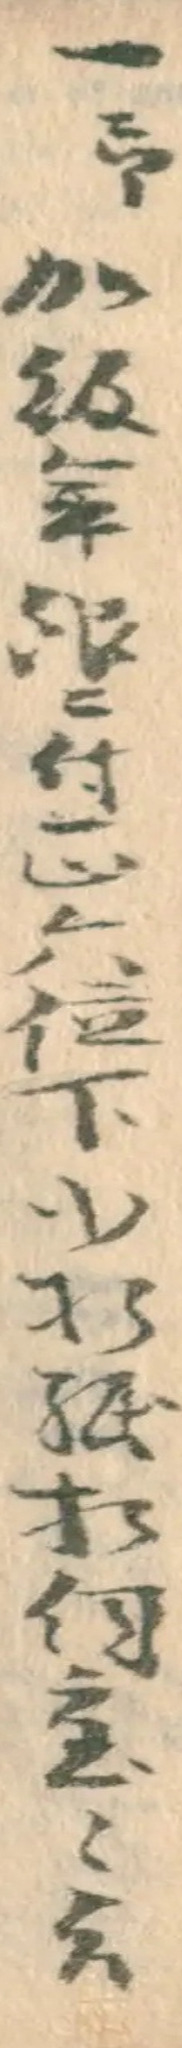一予加級年限ニ付正六位下小折紙相伺置候旨
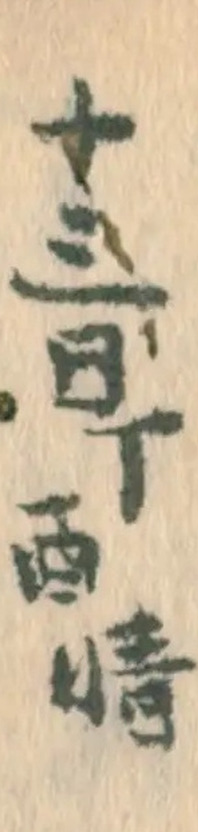十三日丁酉晴
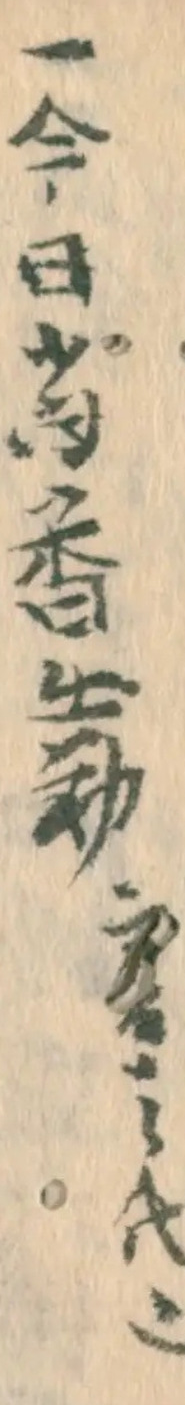一今日当番出勤之代也
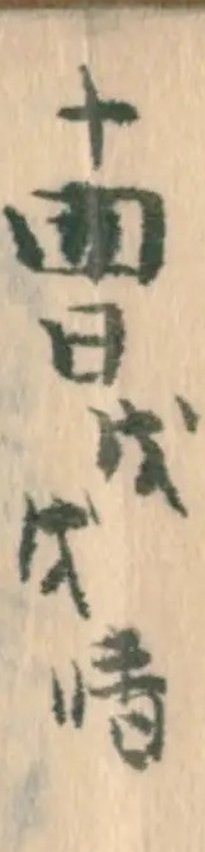十四日戊戌晴
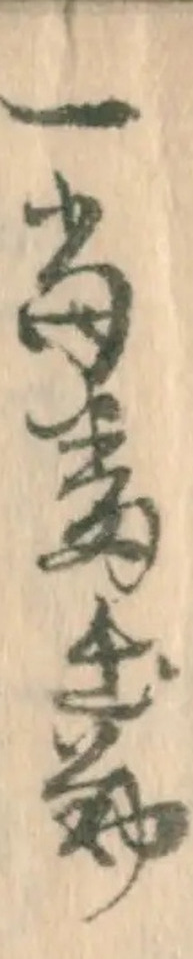一当番出勤
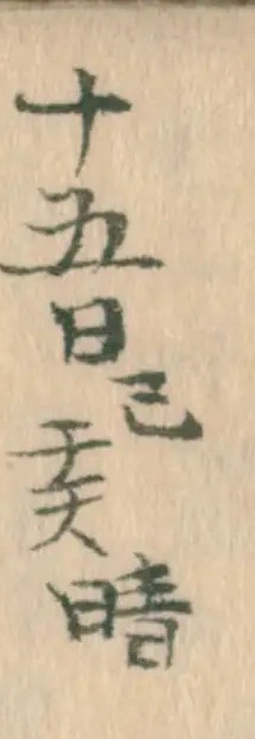十五日己亥晴
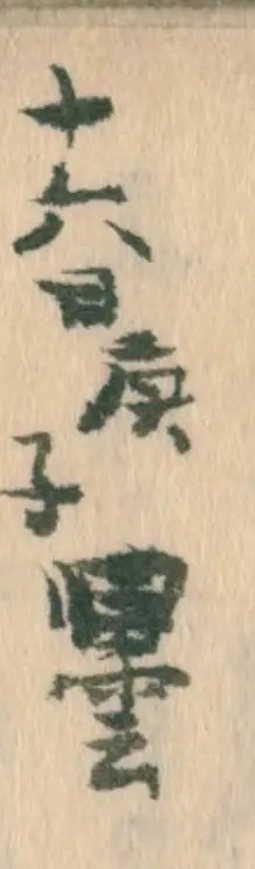十六日庚子曇
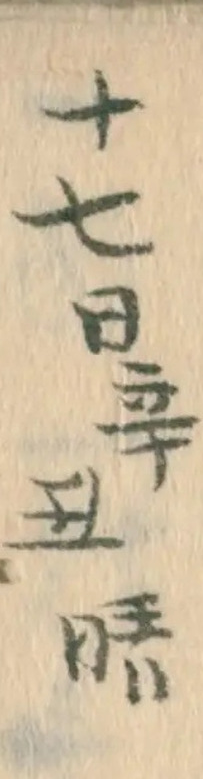十七日辛丑晴

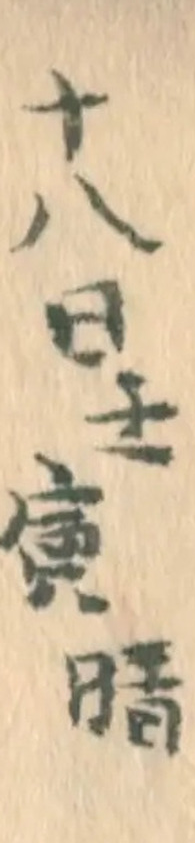十八日壬寅晴
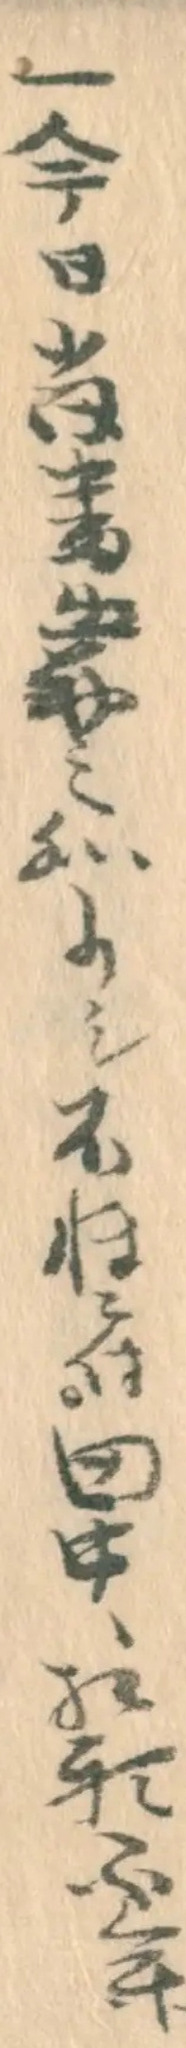一今日当番之処少シ不快ニ付田中へ相頼不参
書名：禁裏御所御用日記. [131]
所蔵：国立国会図書館 National Diet Library, JAPAN
